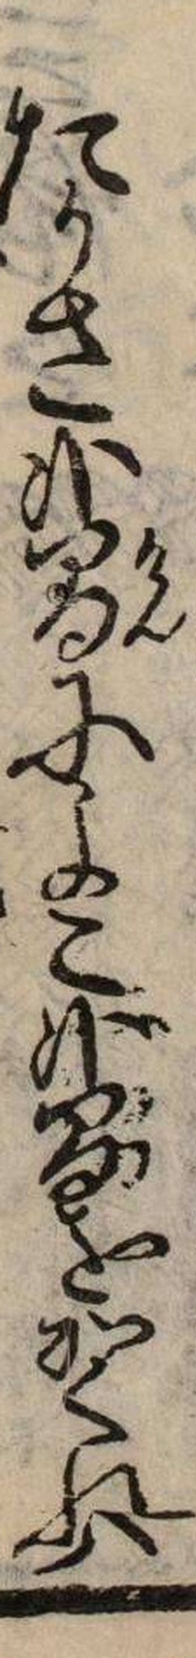たかさ弐間によこ弐間をかくれは
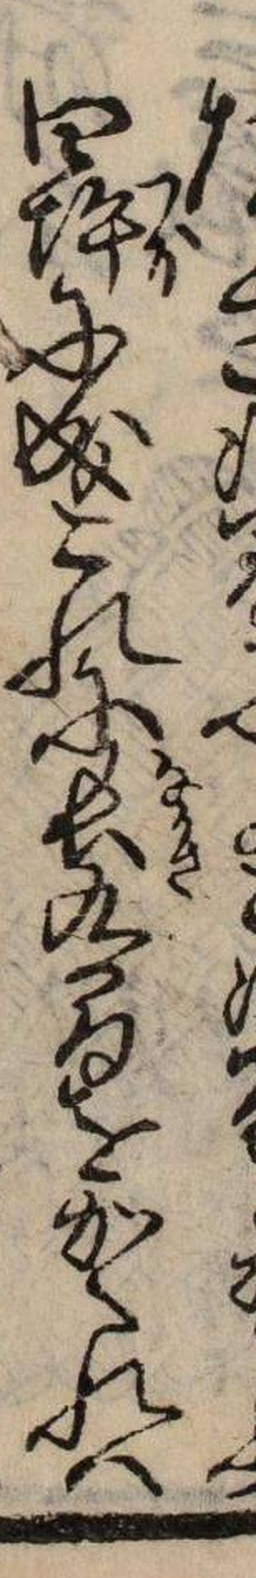四坪に成これに長九間をかくれは
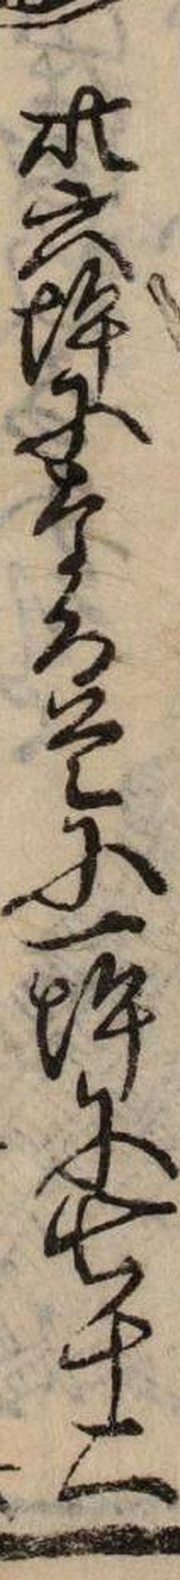卅六坪になる是に一坪に七十二
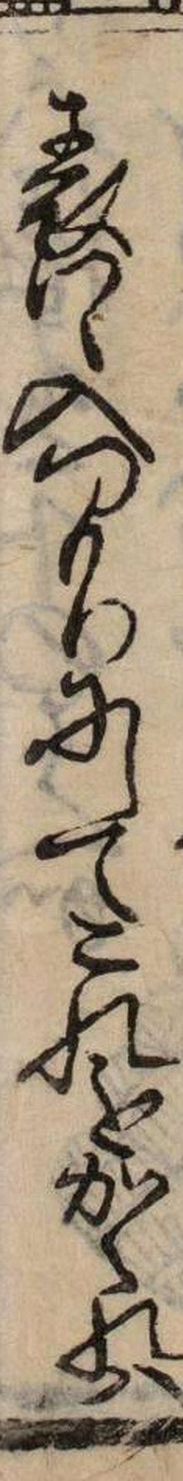表つゝ入つもりにしてこれをかくれは
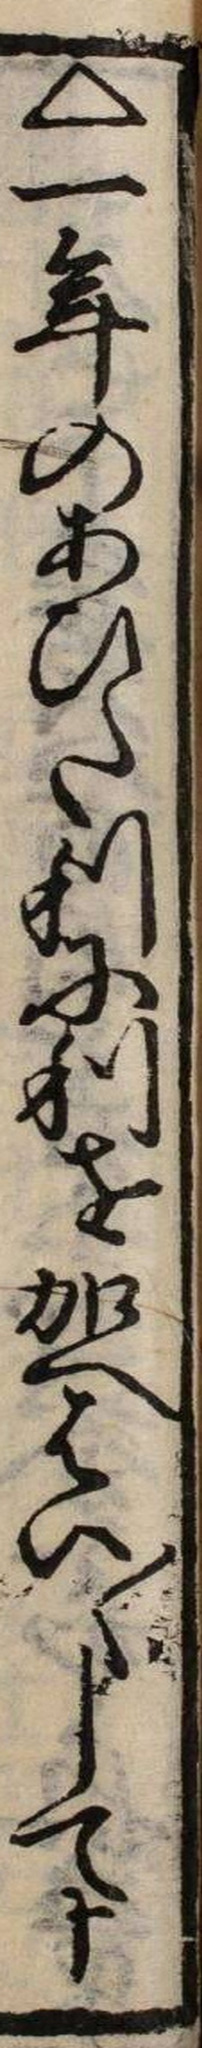△一年のあひた利に利を加へはい〳〵して十
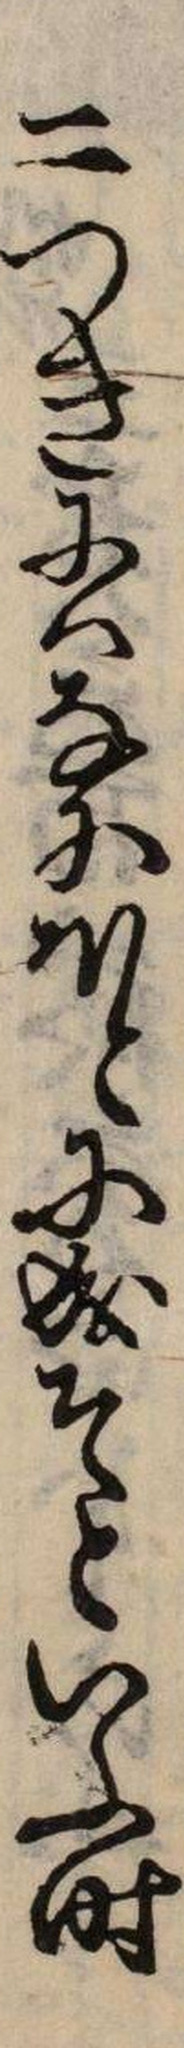二つきにはなにほとに成そといふ時
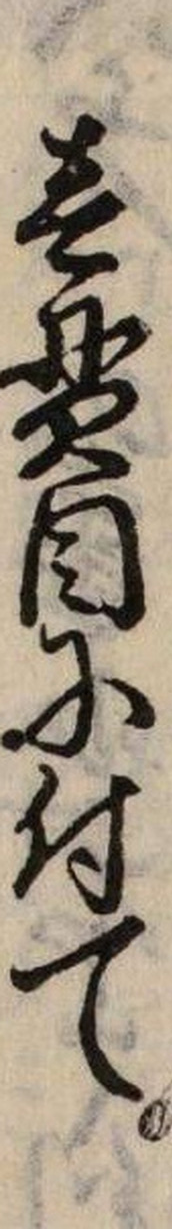壱貫目に付て
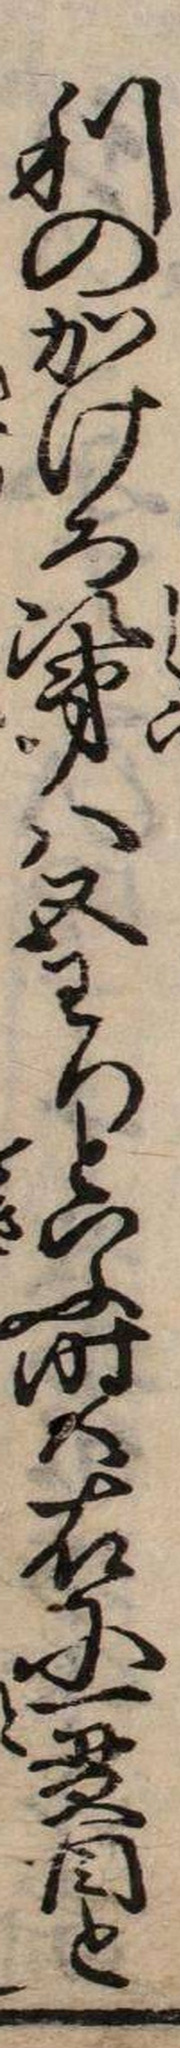利のかける次第は五わりといふ時は右に一貫目と
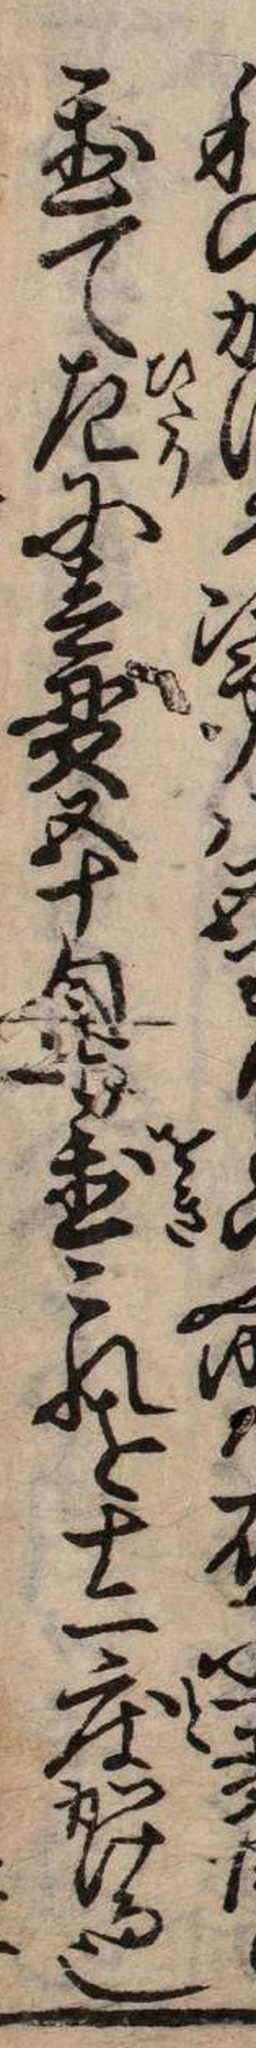置て左に壱貫五十目と置これを十二度かける也

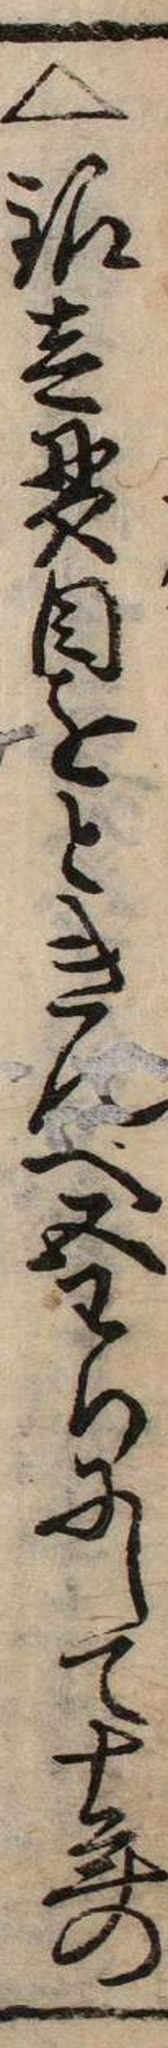△銀壱貫目をときんへ五わりにして十年の
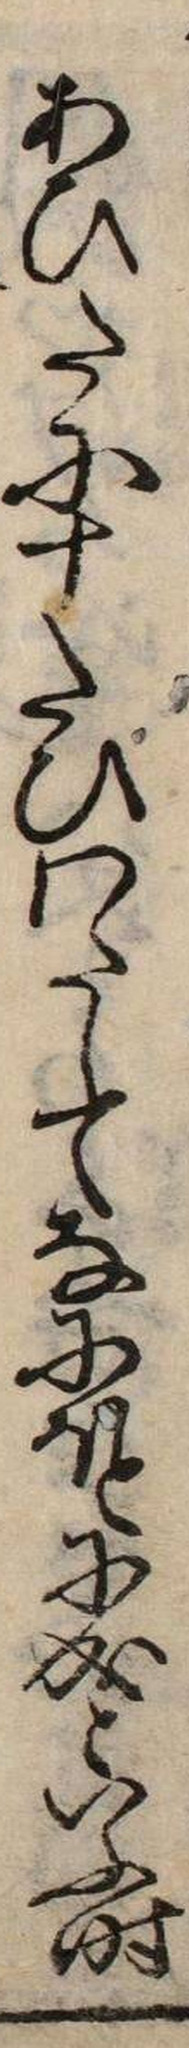あひたに十たひわたしてなにほとに成といふ時
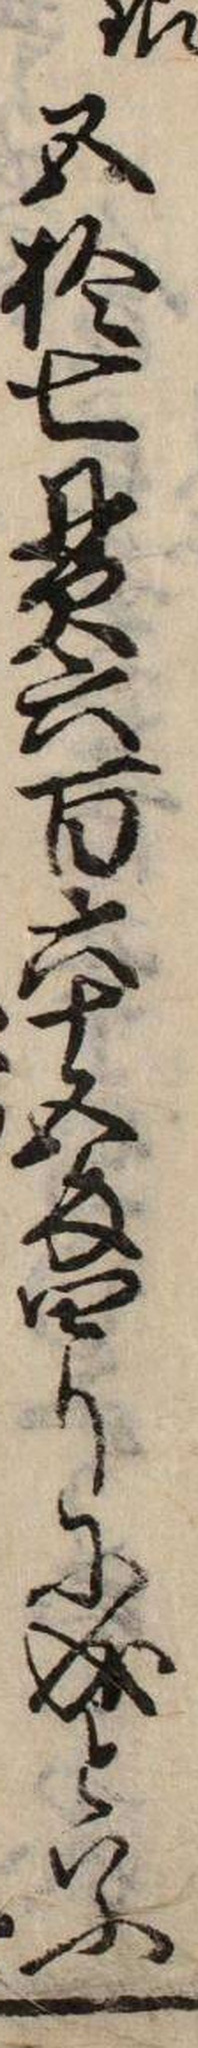銀五拾七貫六百六十五匁四厘に成といふ
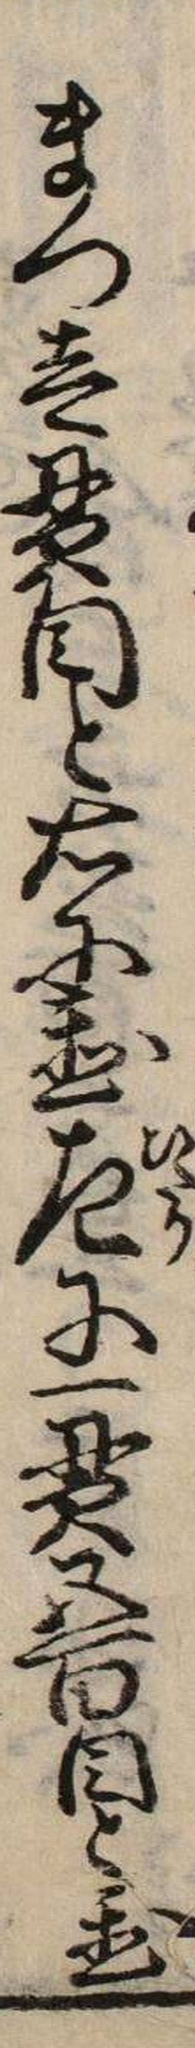まつ壱貫目と右に置左に一貫五百目と置
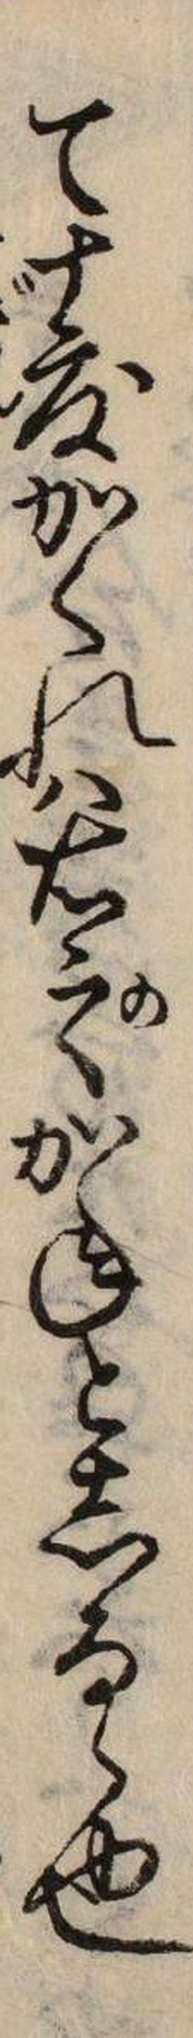て十度かくれは右之かねとしるゝ也
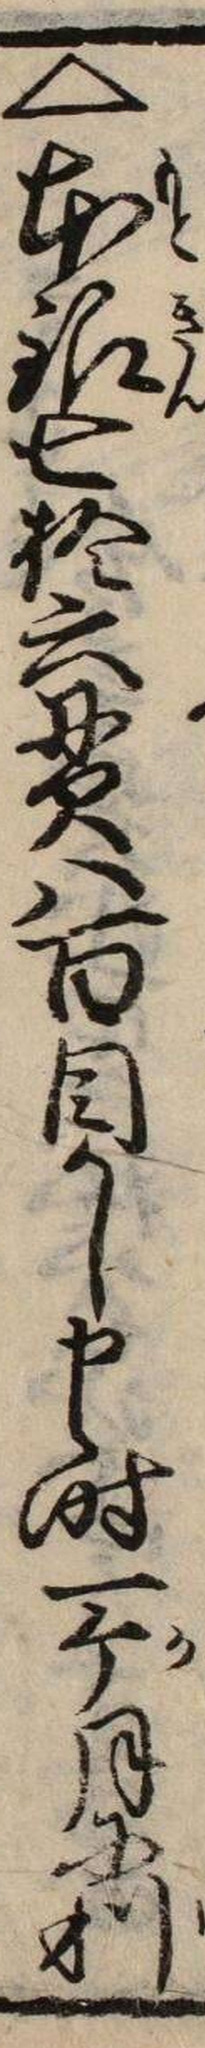△本銀七拾六貫八百目かし申時一ケ月に利
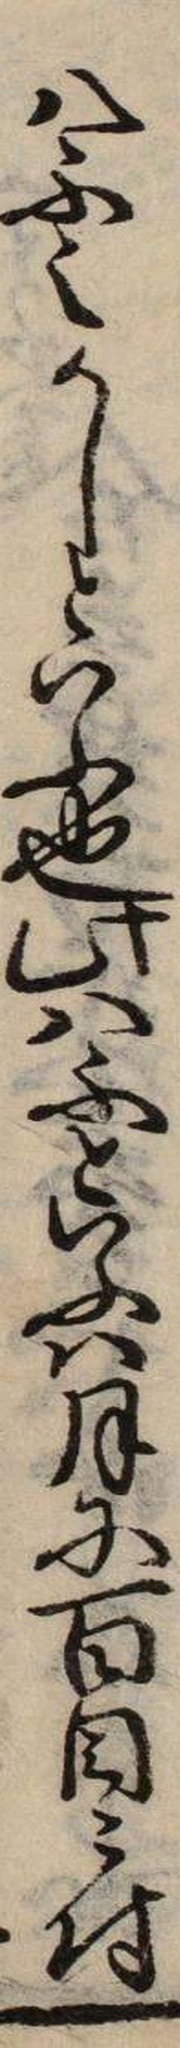八ふのかしといふ也此八ふといふは月に百目に付
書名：塵劫記（寛永11年自跋、京都府立京都学・歴彩館追貴8）
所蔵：京都府立京都学・歴彩館 国文学研究資料館
